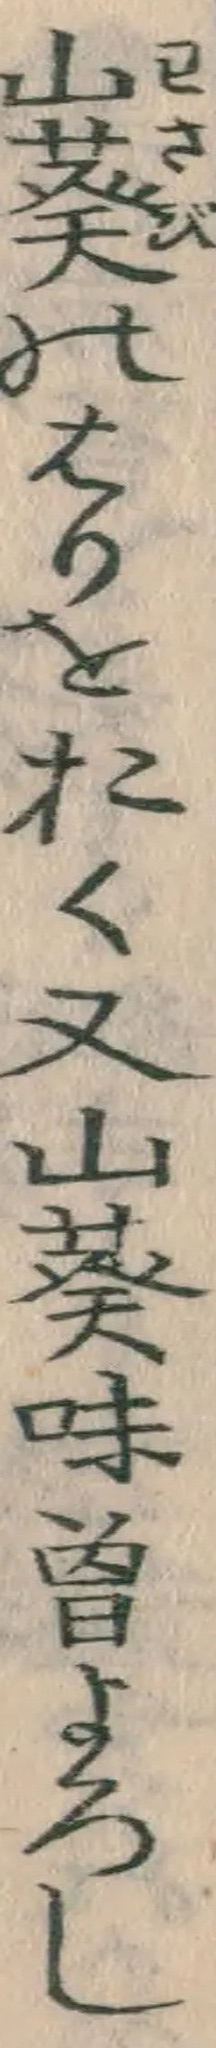山葵のはりをおく又山葵味噌よろし
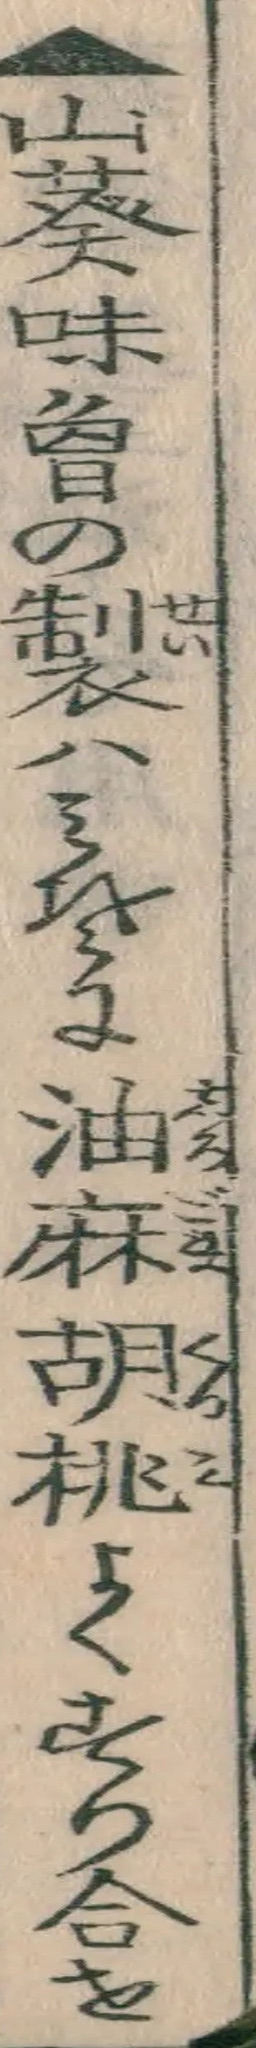▲山葵味曽の製はみそに油麻胡桃よくすり合せ
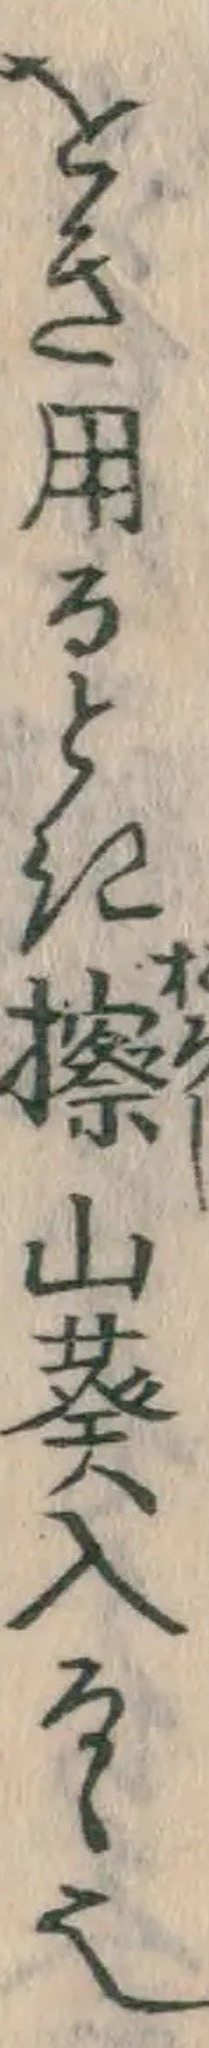をき用るとき擦山葵入るゝ也
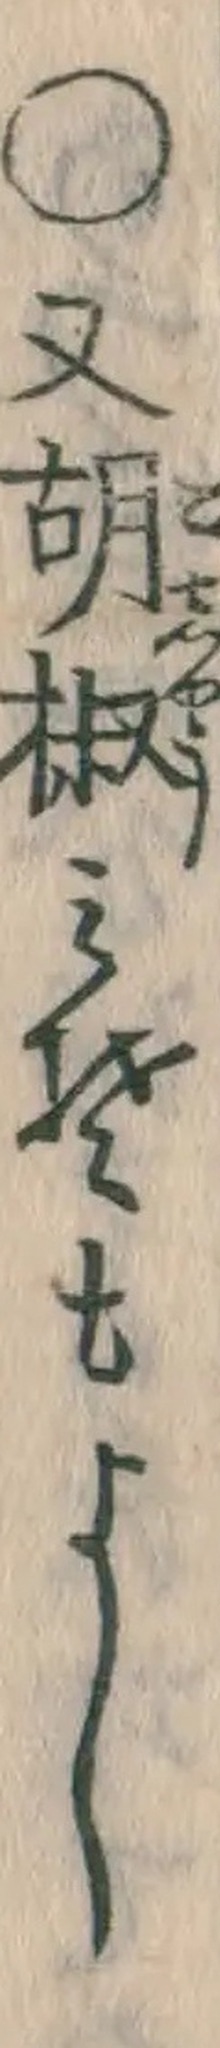○又胡椒みそもよし

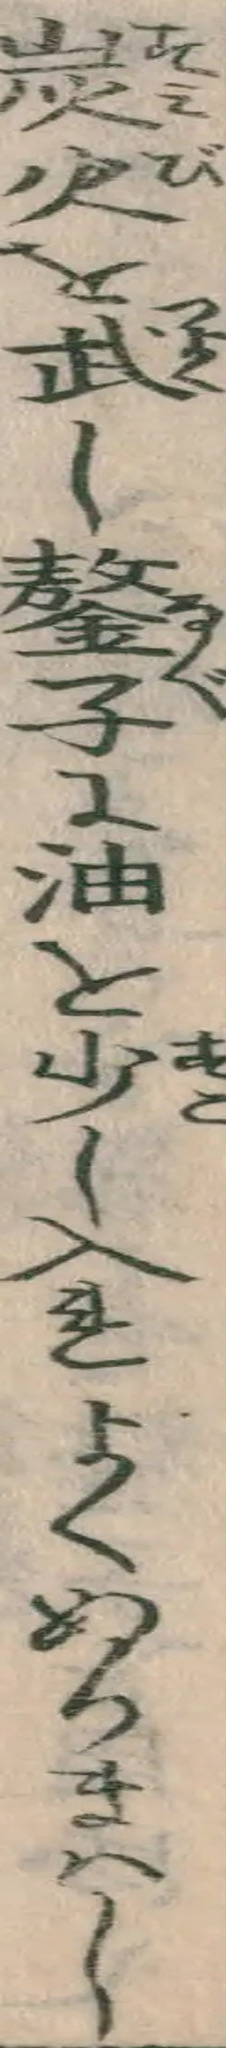炭火を武し鏊子に油を少し入れよくぬりまはし
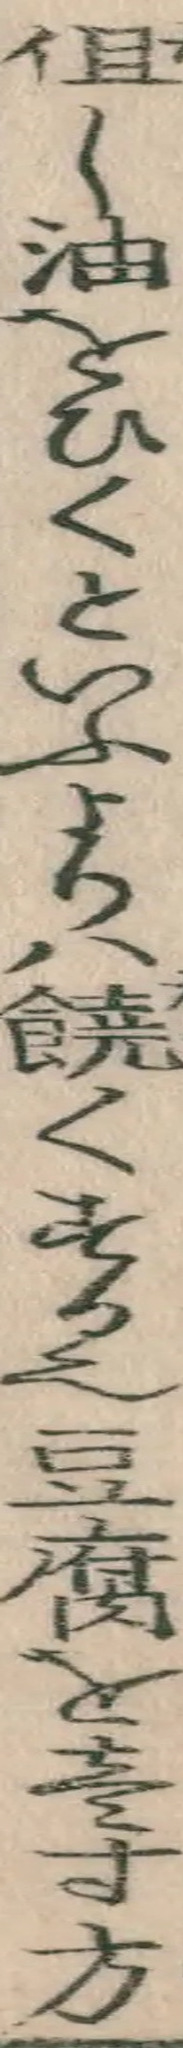但し油をひくといふよりは饒くする也豆腐を壱寸方
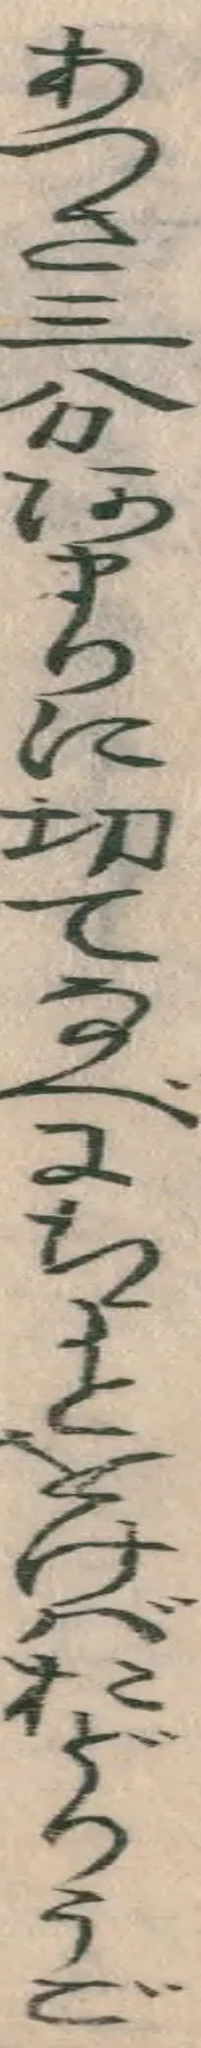あつさ三分あまりに切てなべにちよとをけばおどりうご
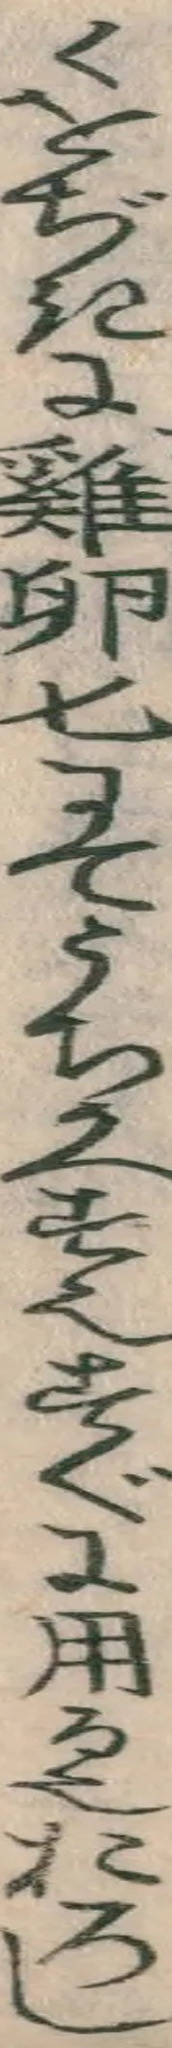くをぢきに鶏卵匕にてうちかへす也すぐに用る也おろし
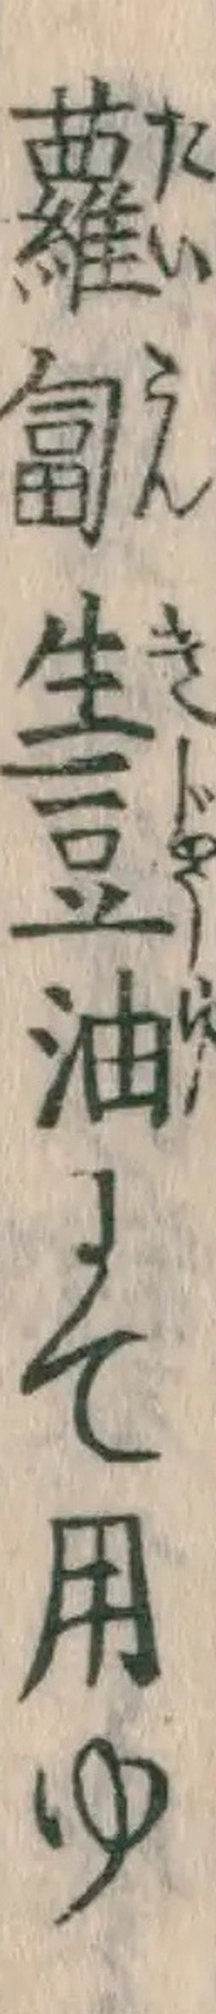蘿匐生豆油にて用ゆ
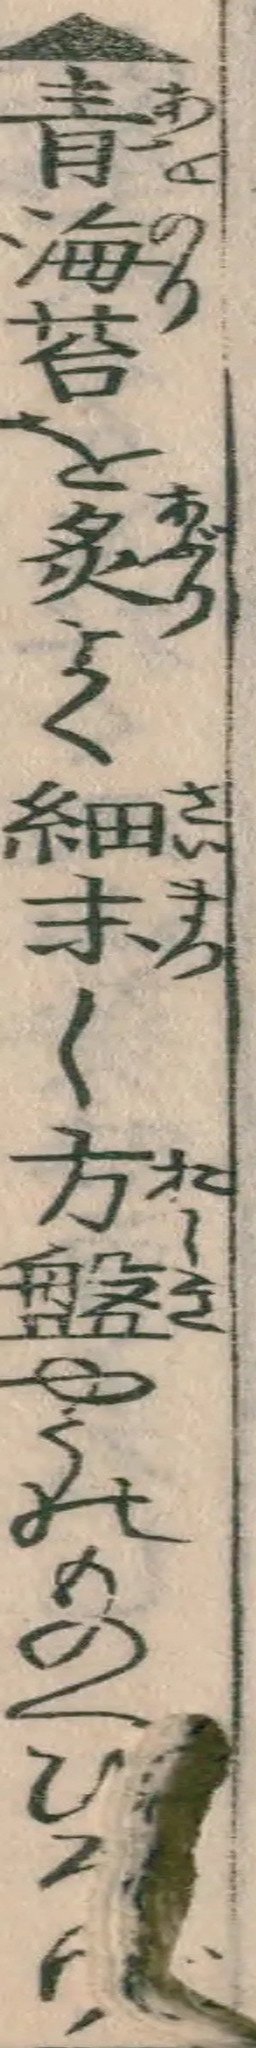▲青海苔を炙よく細末し方盤やうのものへひろげ
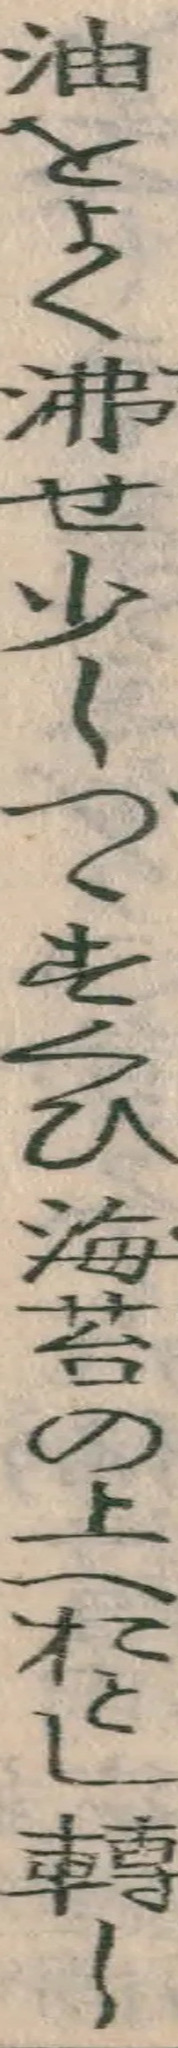油をよく沸せ少しづゝすくひ海苔の上へおとし転し
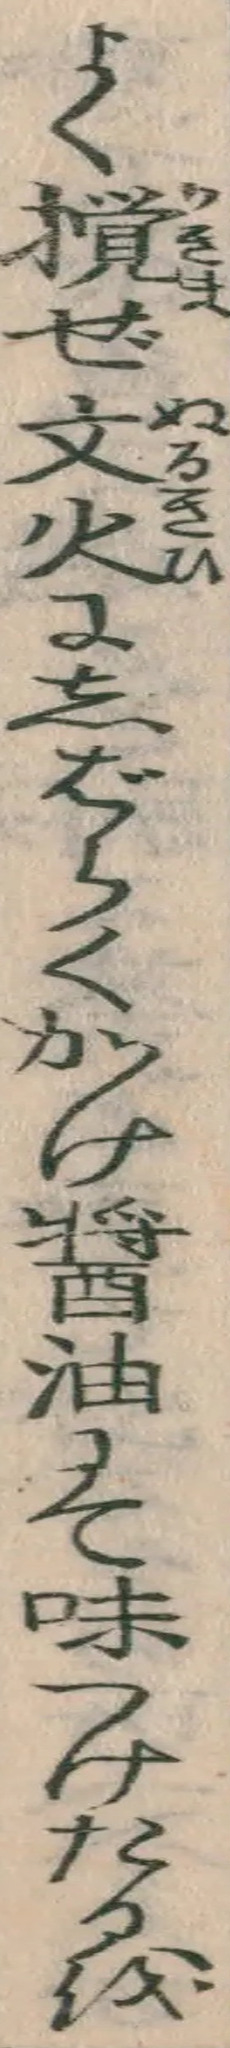よく攪ぜ文火にしばらくかけ醤油にて味つけたるを
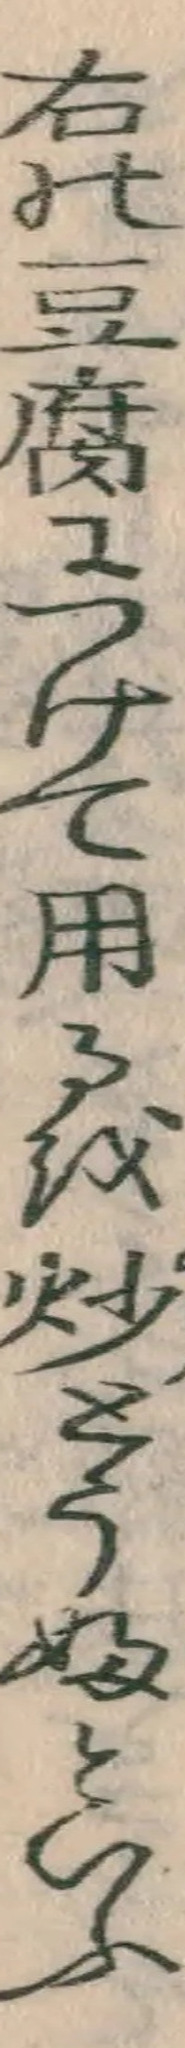右の豆腐につけて用るを炒とうふといふ
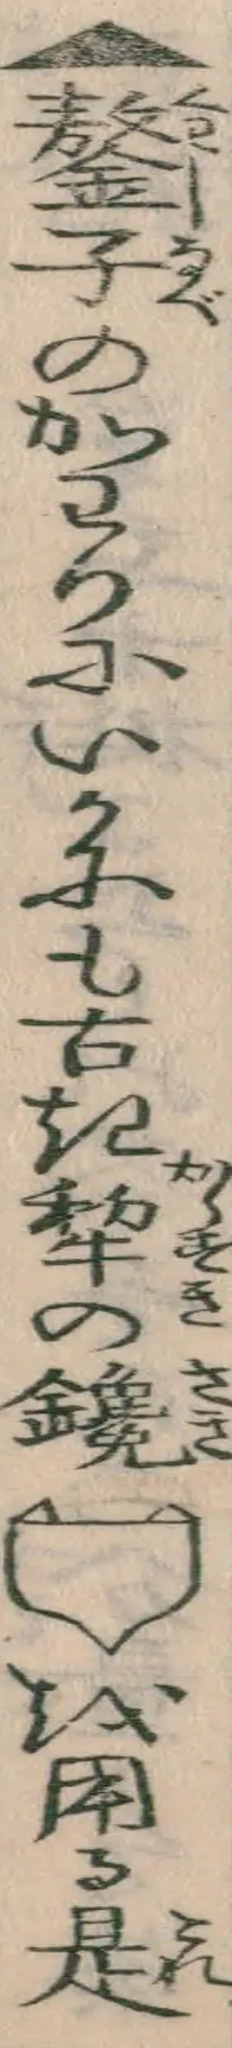▲鏊子のかわりにいかにも古き犂の鑱を用る是
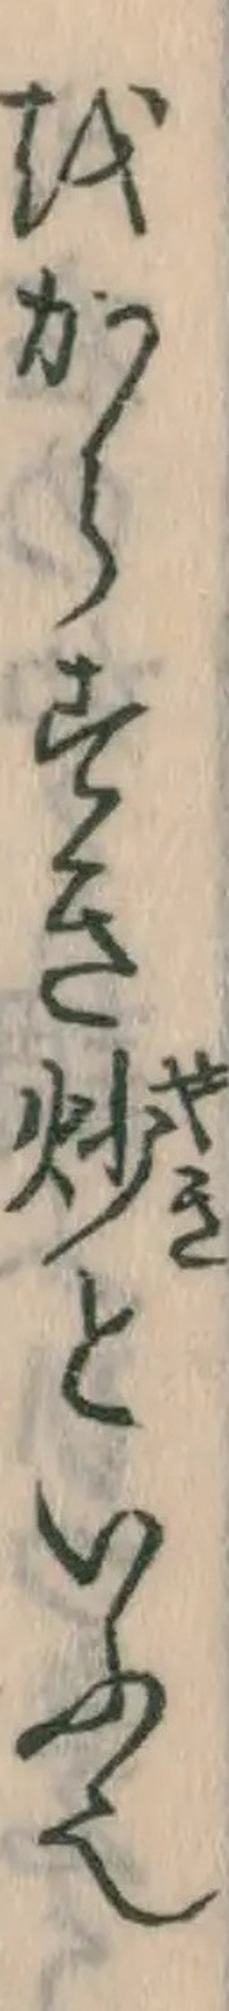をからすき炒といふ也
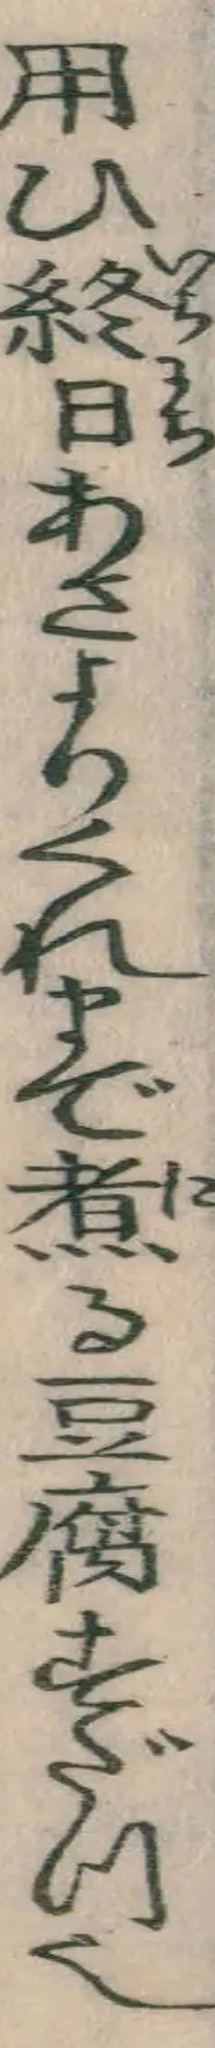用ひ終日あさよりくれまで煮る豆腐すだつ也
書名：豆腐百珍. [正編]
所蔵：国立国会図書館 National Diet Library, JAPAN
